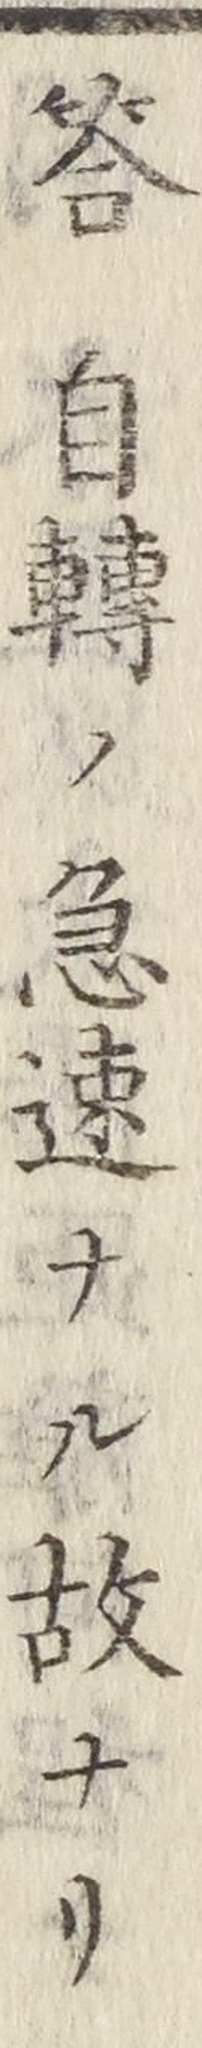答自転ノ急速ナル故ナリ
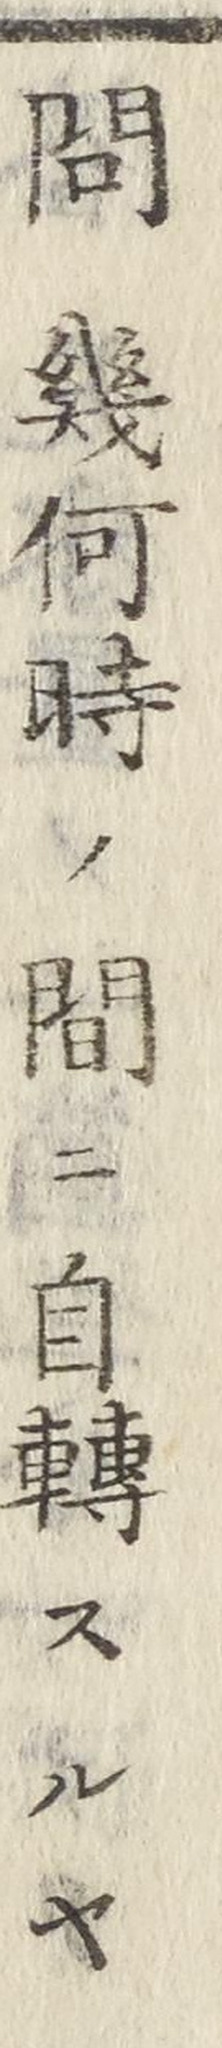問幾何時ノ間ニ自転スルヤ
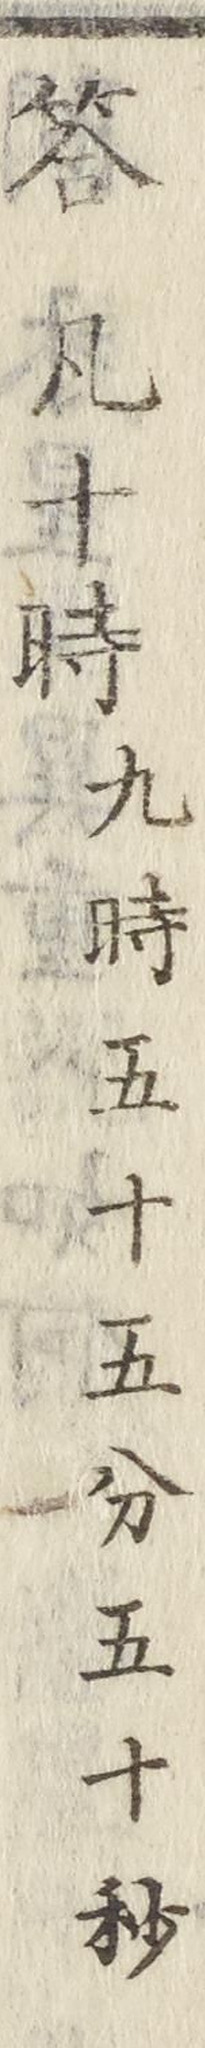答凡十時九時五十五分五十秒
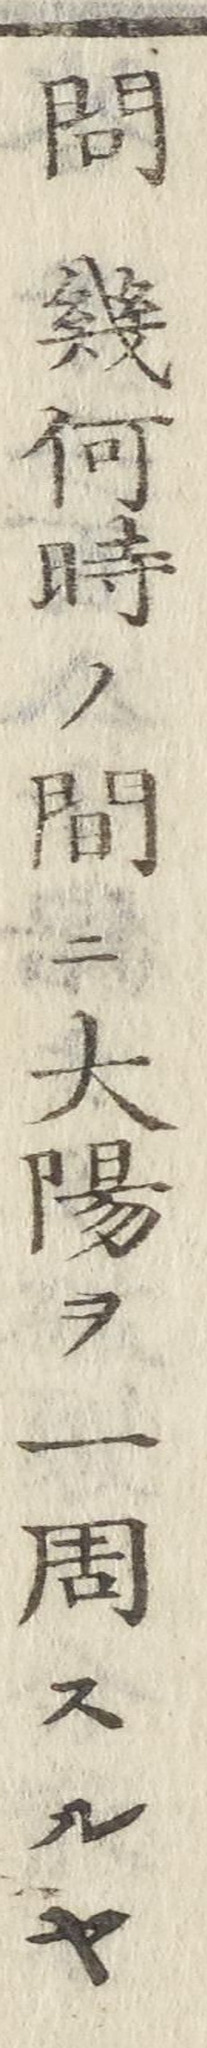問幾何時ノ間ニ大陽ヲ一周スルヤ
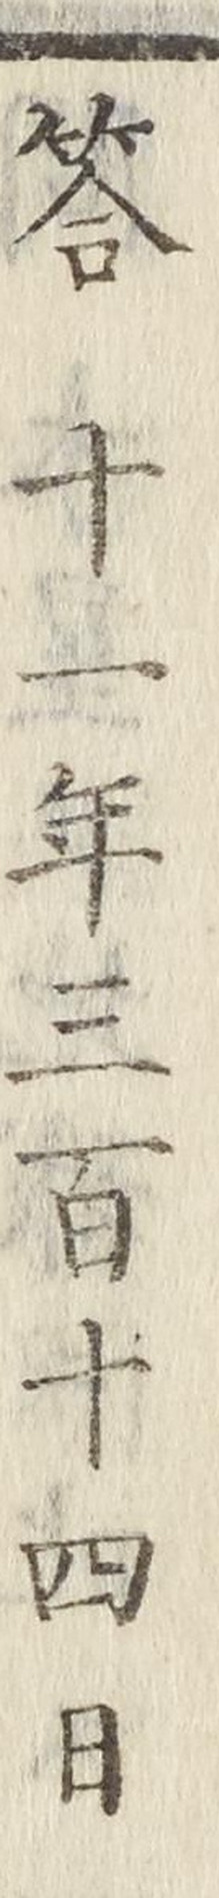答十一年三百十四日
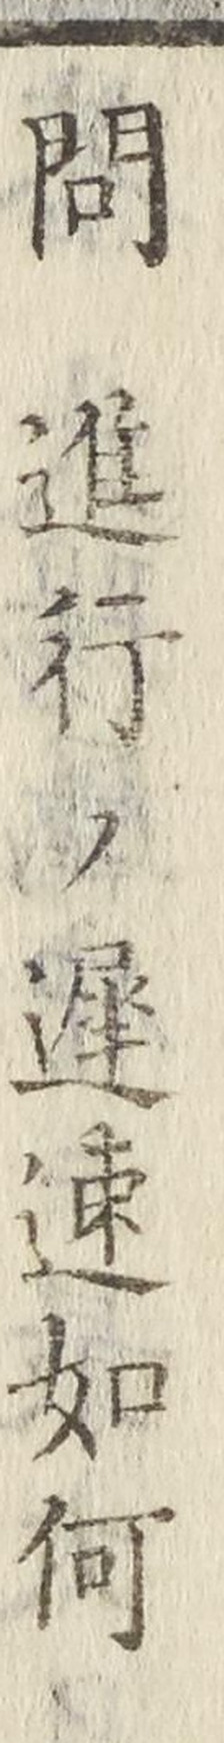問進行ノ遅速如何
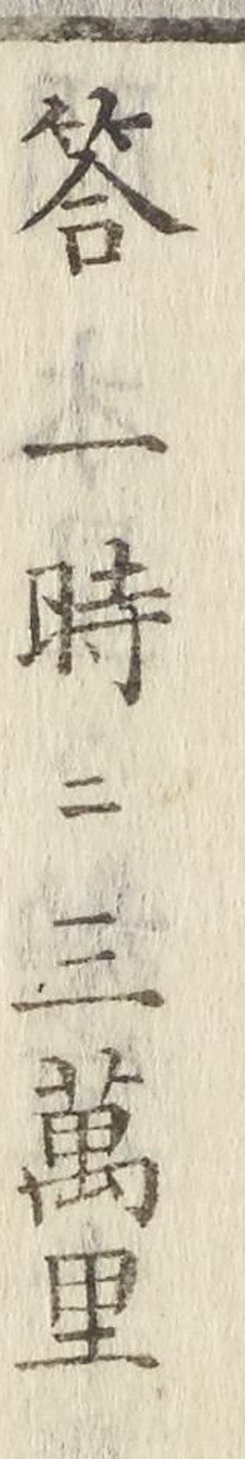答一時ニ三万里
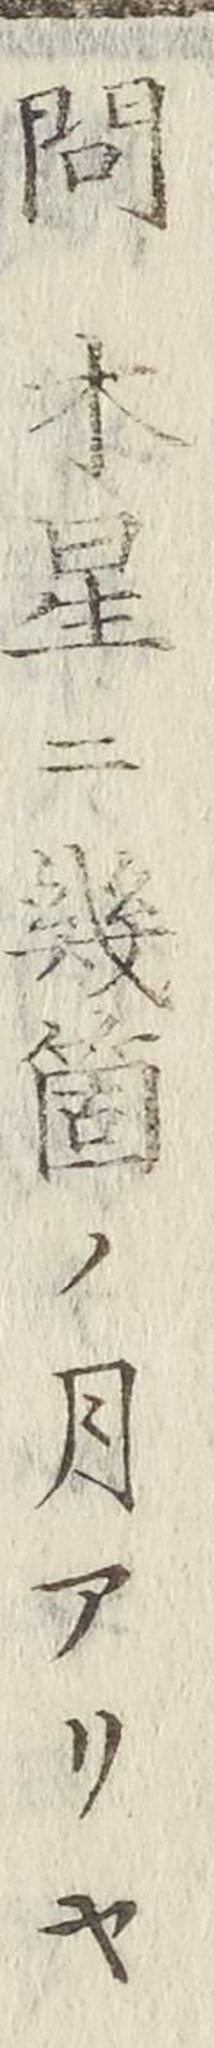問木星ニ幾箇ノ月アリヤ
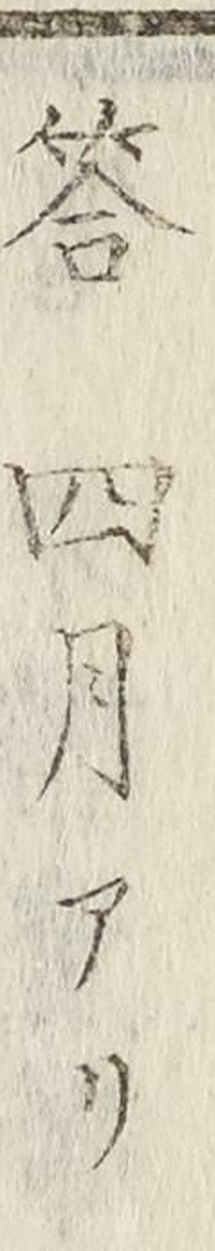答四月アリ
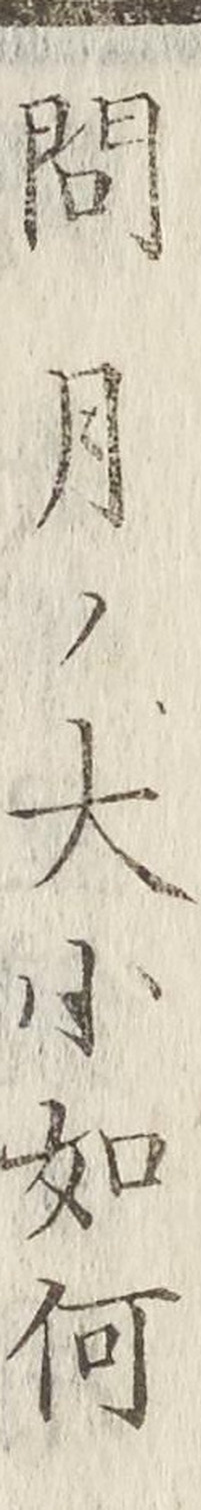問月ノ大小如何
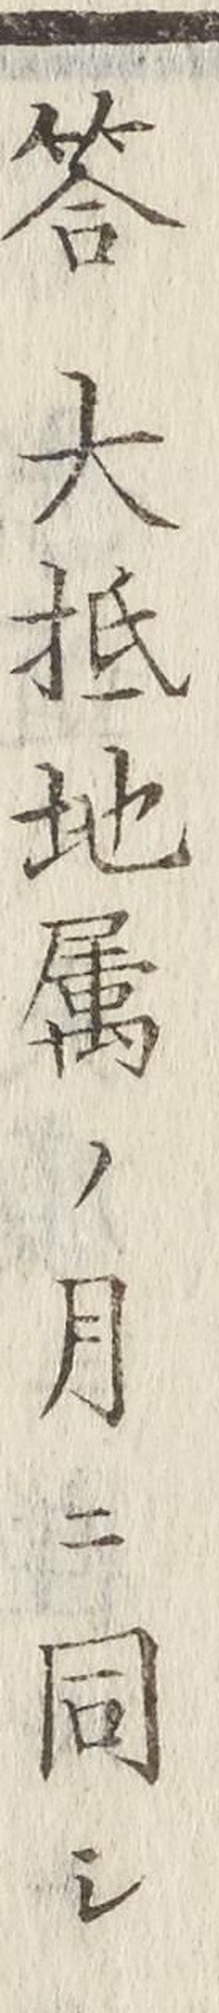答大抵地属ノ月ニ同シ
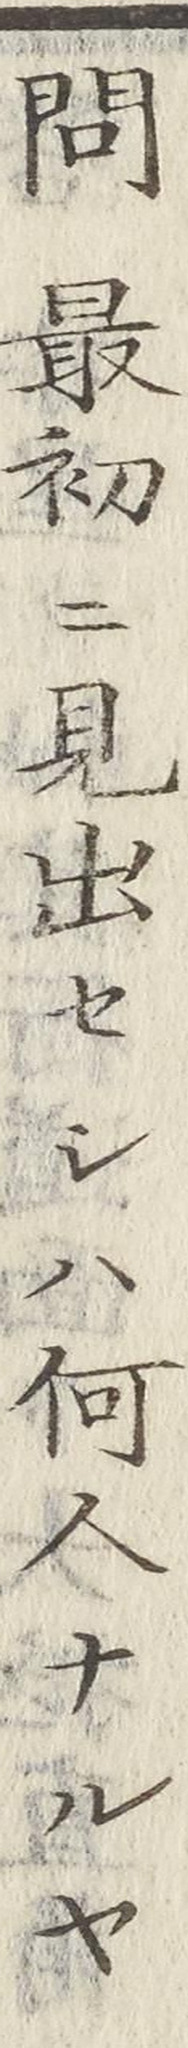問最初ニ見出セシハ何人ナルヤ
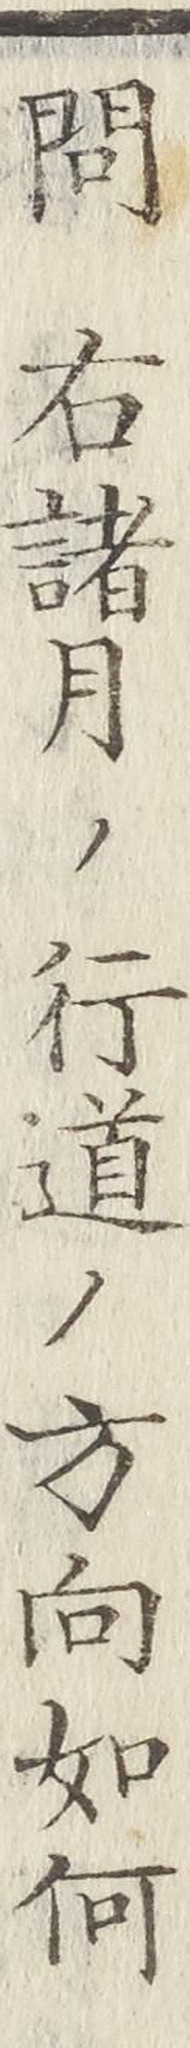問右諸月ノ行道ノ方向如何
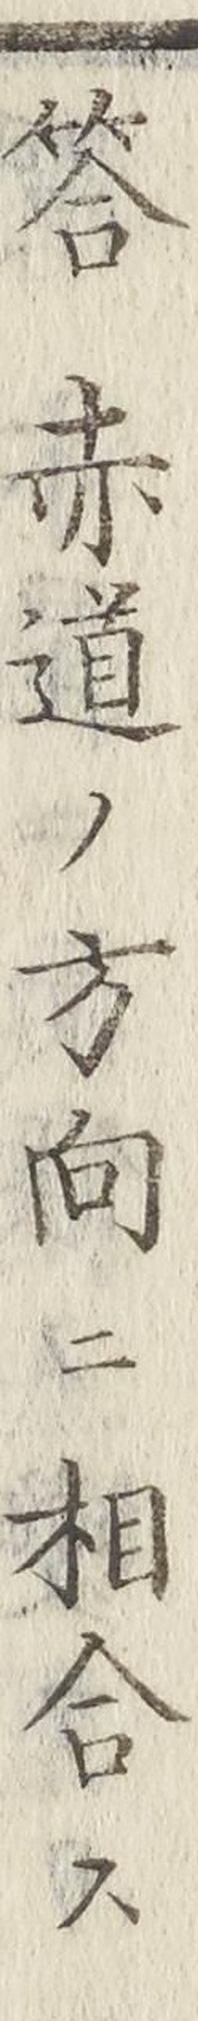答赤道ノ方向ニ相合ス
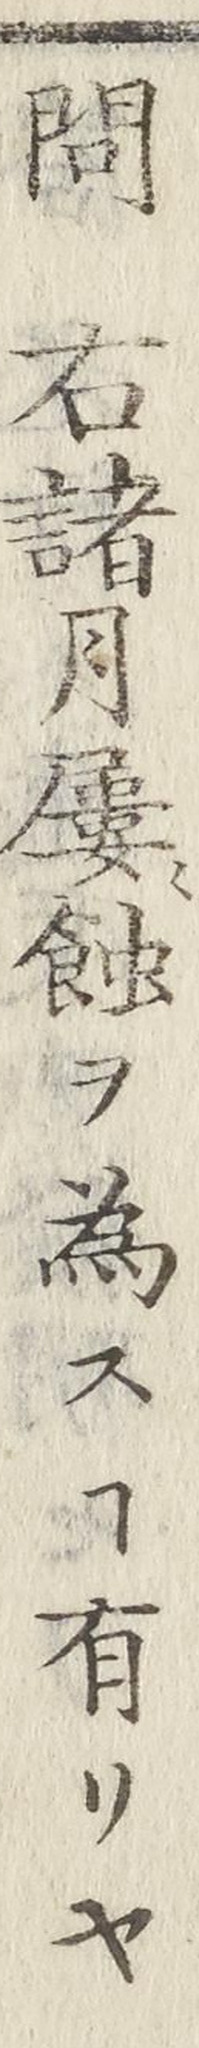問右諸月屢々蝕ヲ為スコト有リヤ
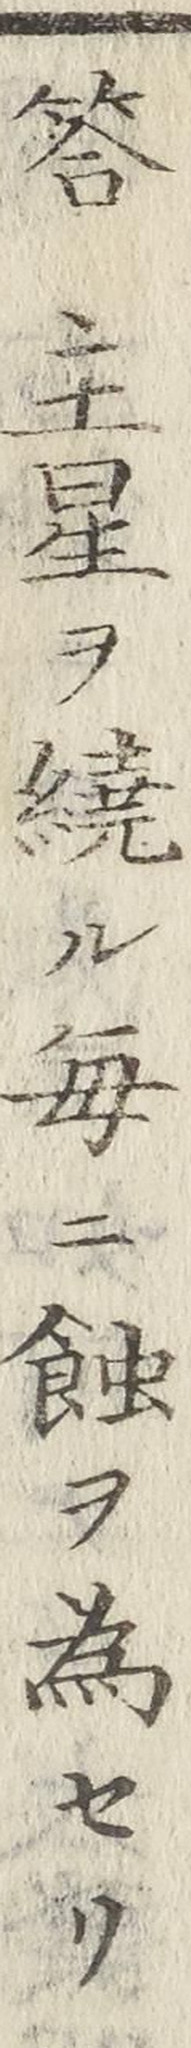答主星ヲ繞ル毎ニ蝕ヲ為セリ
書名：星学圖説　上
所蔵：東京大学地震研究所図書室 Earthquake Research Institute Library, The University of Tokyo, JAPAN
